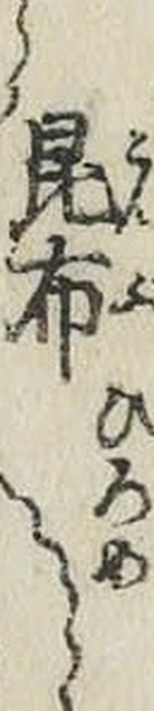昆布ひろめ
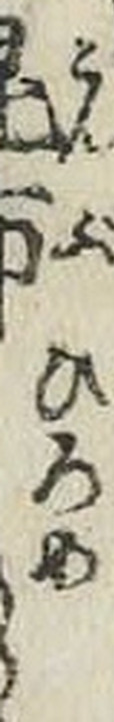昆布ひろめ
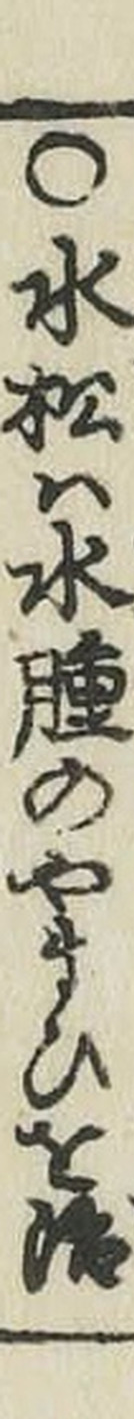○水松は水腫のやまひを治
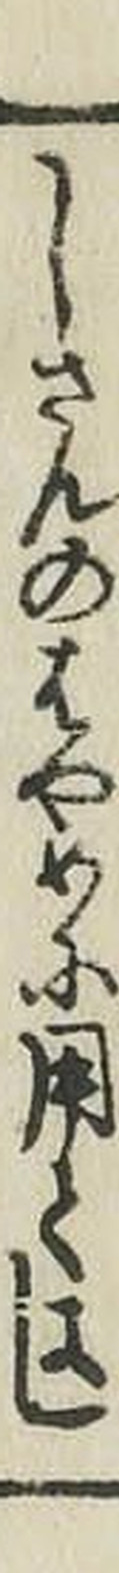しさんのはやめに用てよし
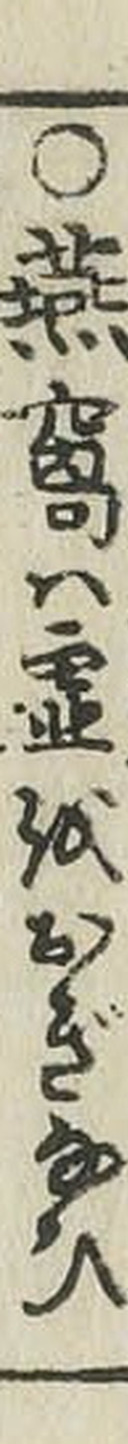○燕窩は虚をおぎなひ
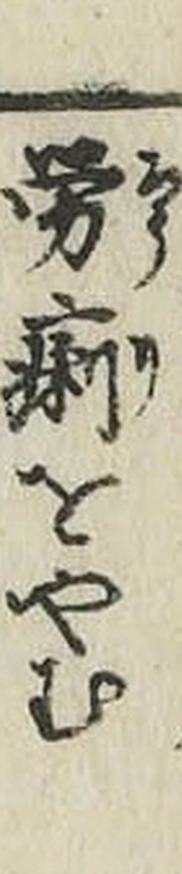労痢をやむ
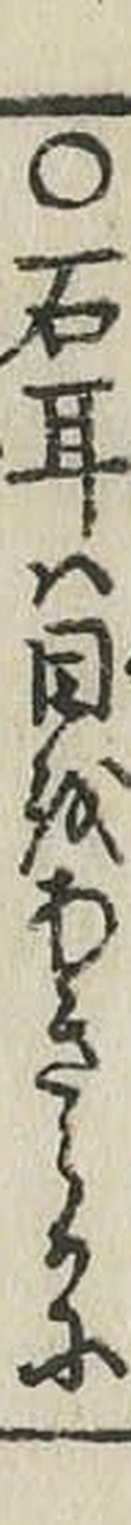○石耳は目をあきらかに
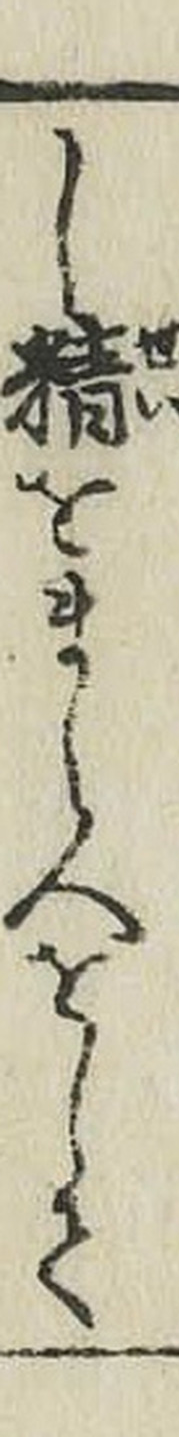し精をまし人をして
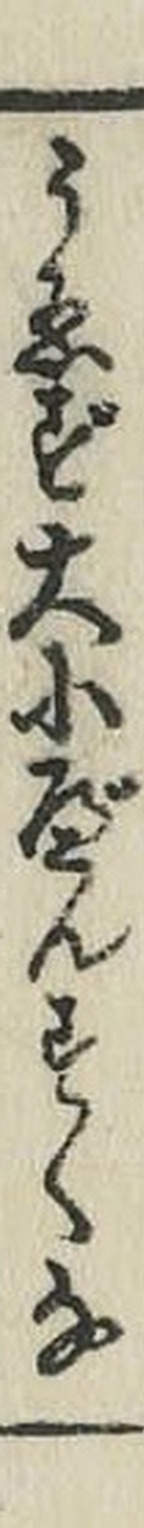うゑず大小べんすくな

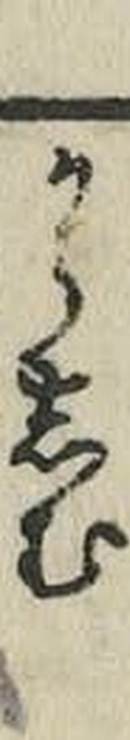からしむ
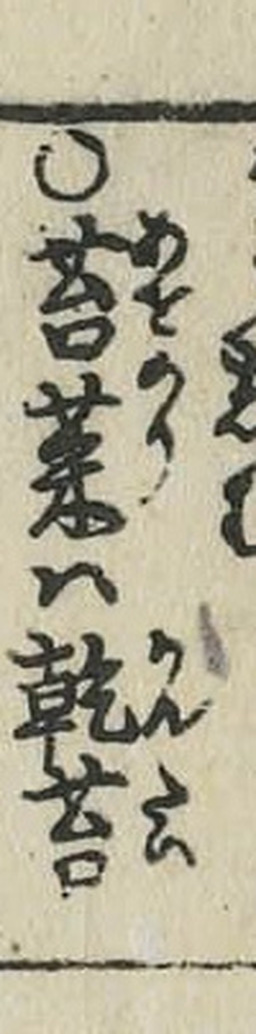○苔菜は乾苔
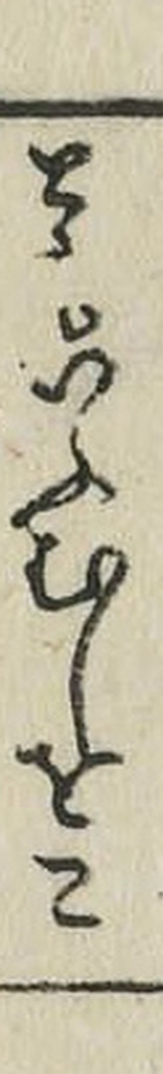ともいふむしをこ
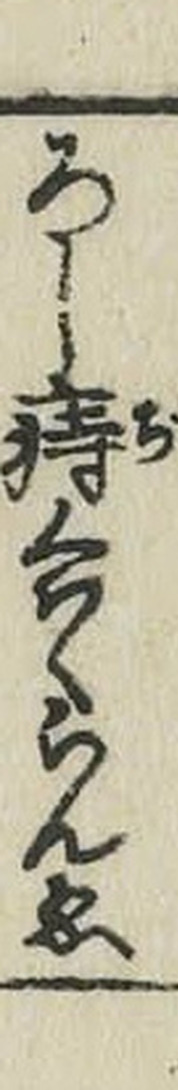ろし痔くわくらんゑ
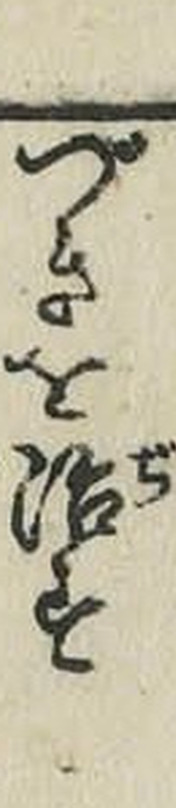づきを治す
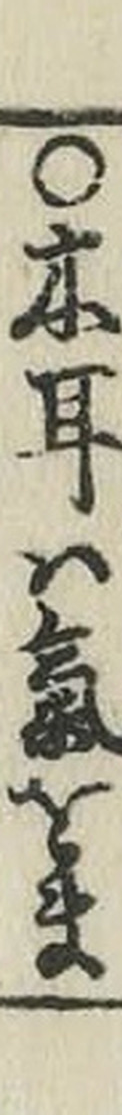○木耳は気をま
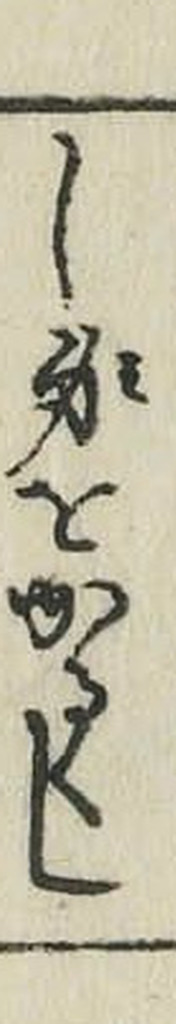し身をかるくし
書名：増補頭書訓蒙図彙大成 10巻 8:巻之17-19
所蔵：東京学芸大学教育コンテンツアーカイブ
